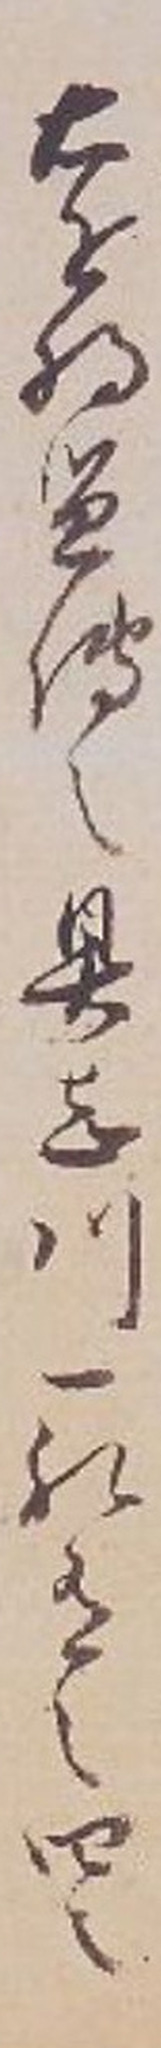右近将監伝之具志川一礼有之四之
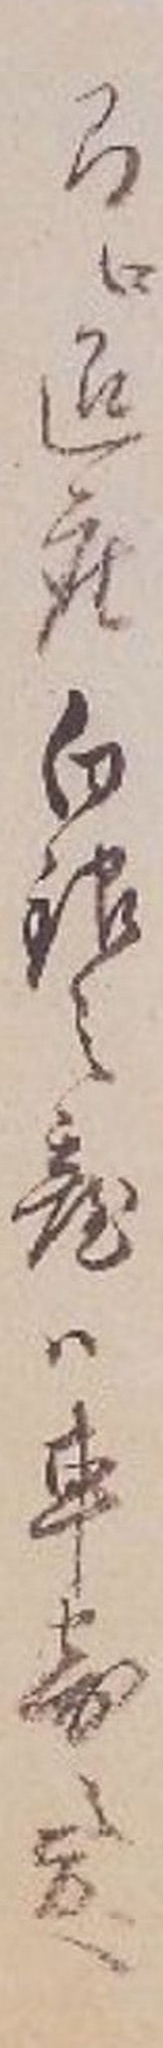間え退座白銀之台は車寄之方へ
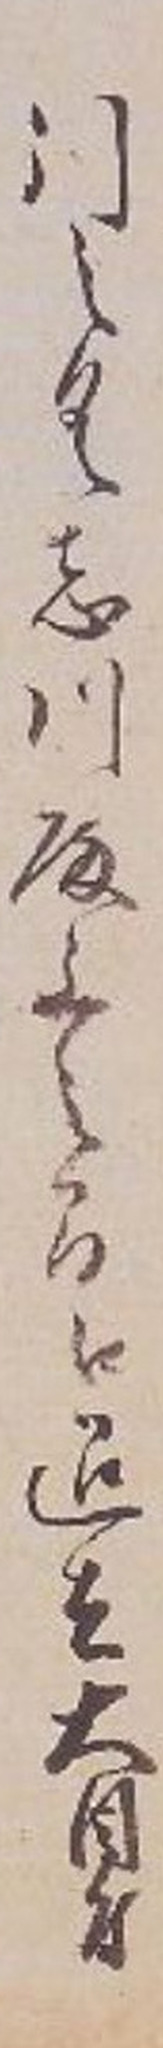引之具志川殿上之間え退去大目付
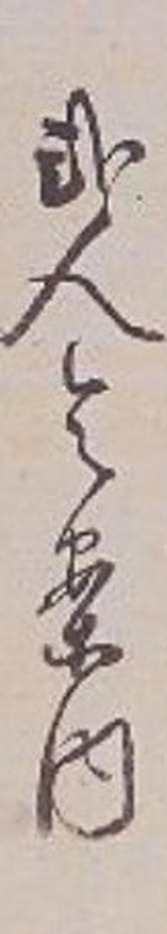弐人令案内
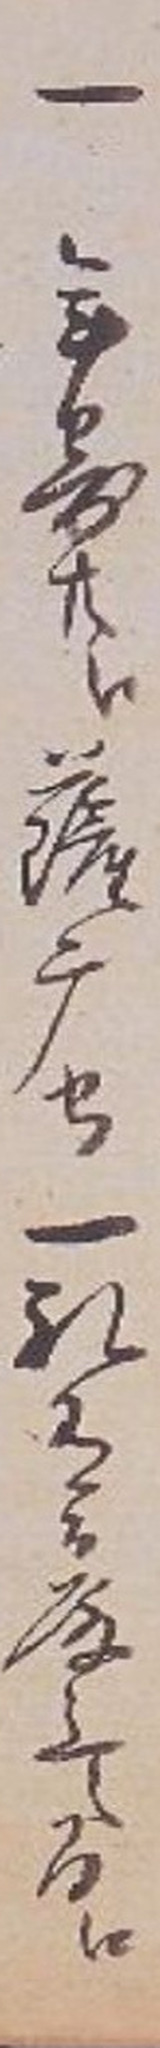一年寄共え薩摩守一礼有而殿上之間え

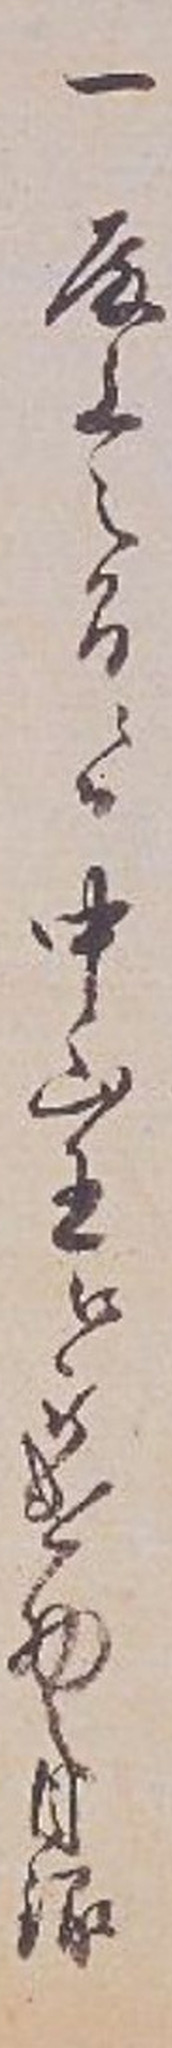一殿上之間に而中山王え被遣物目録
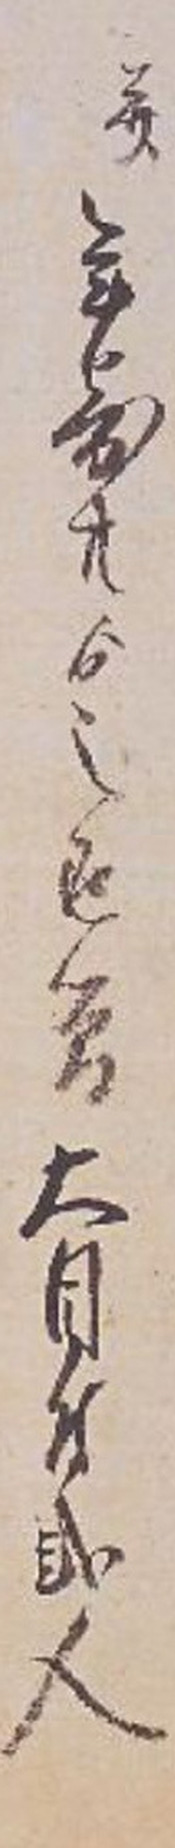幷年寄共ゟ之返簡大目付弐人
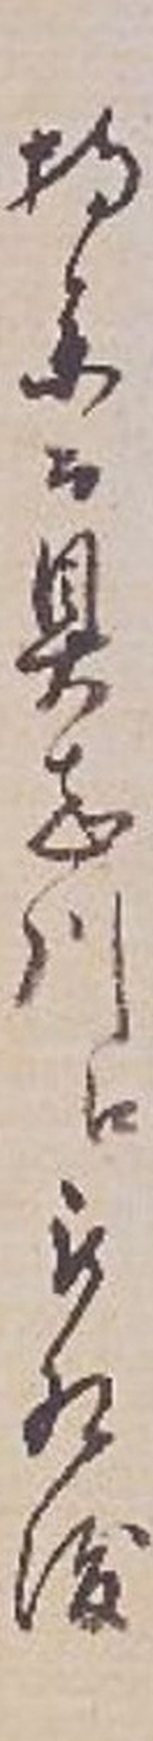持参而具志川え被相渡
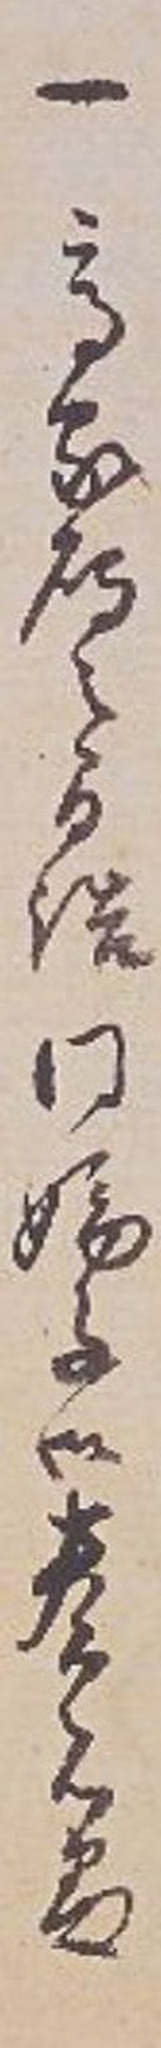一高家雁之間詰同嫡子御奏者番
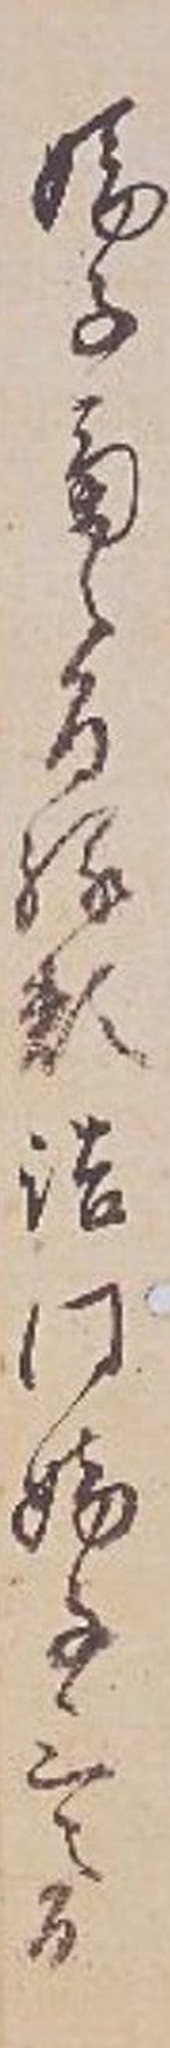嫡子菊之間縁頬詰同嫡子三之間
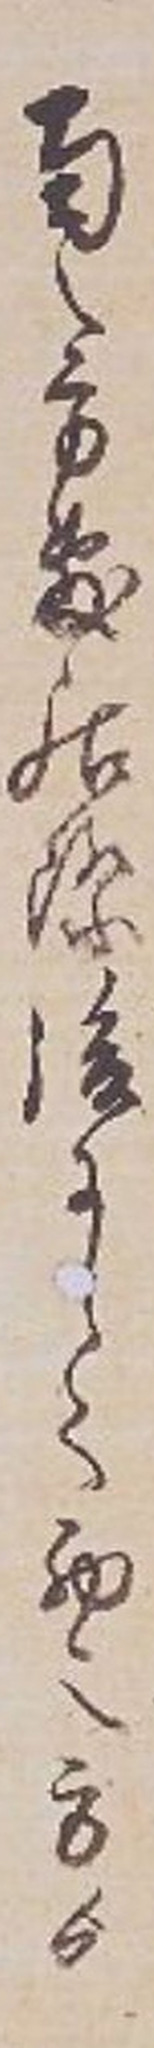南之方敷居際後にして西之方ゟ
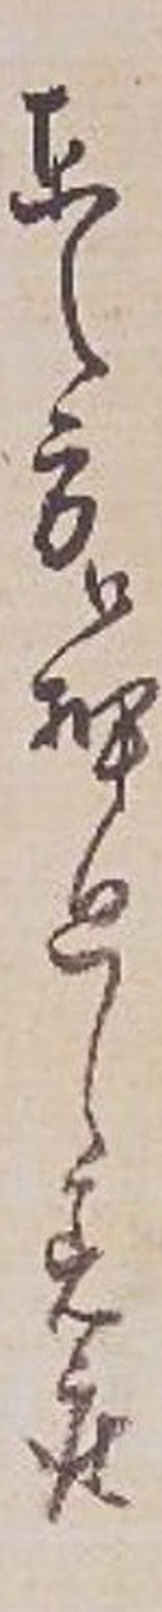東之方え押廻し着座
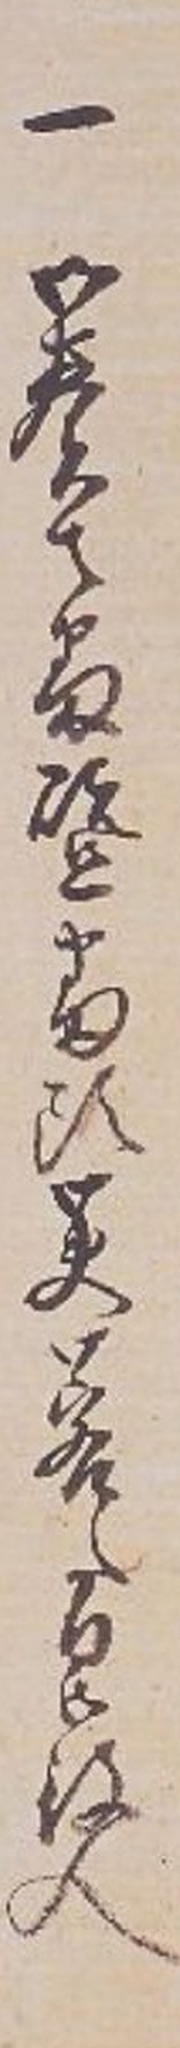一御奏者番頭廻番頭芙蓉之間御役人
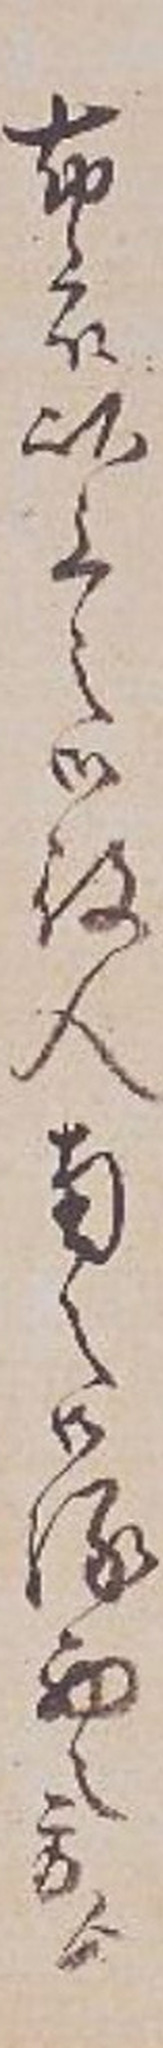布衣以上之御役人南之御縁西之方ゟ
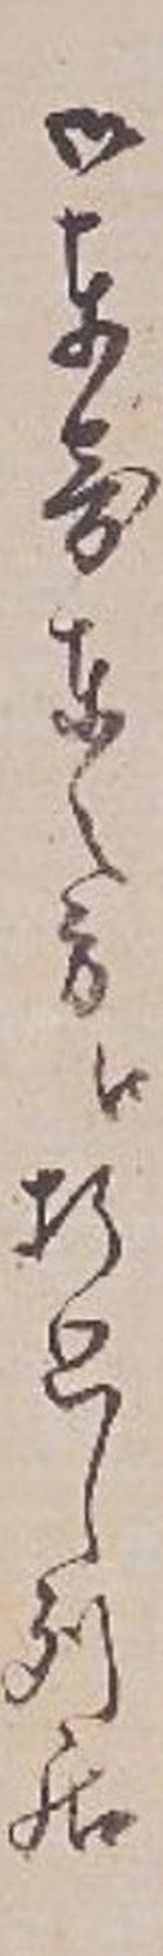御車寄東之方え折廻し列居
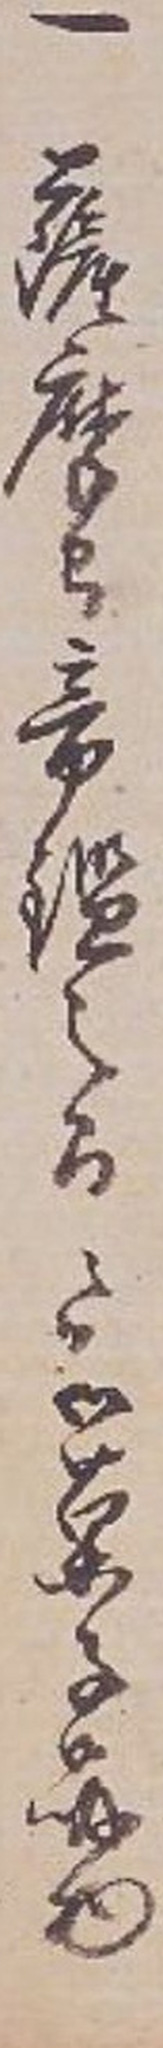一薩摩守帝鑑之間に而御菓子御吸物
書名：琉球人来朝記 八、九
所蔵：University of the Ryukyus Library
